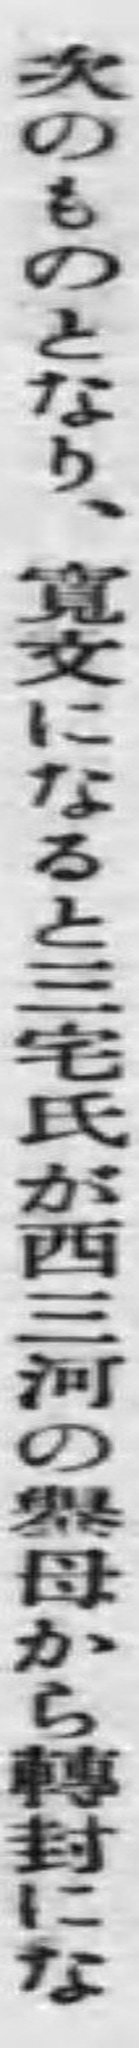次のものとなり、寛文になると三宅氏が西三河の挙母から転封にな
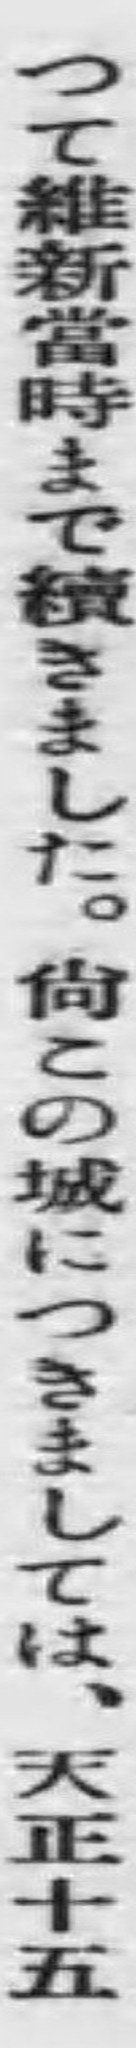つて維新当時まで続きました。尚この城につきましては、天正十五
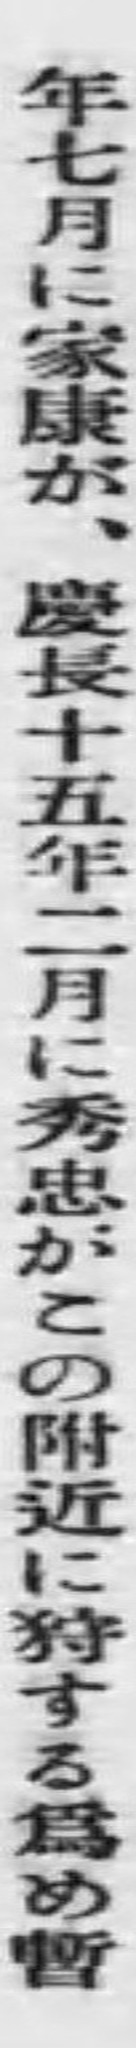年七月に家康が、慶長十五年二月に秀忠がこの附近に狩する為め暫
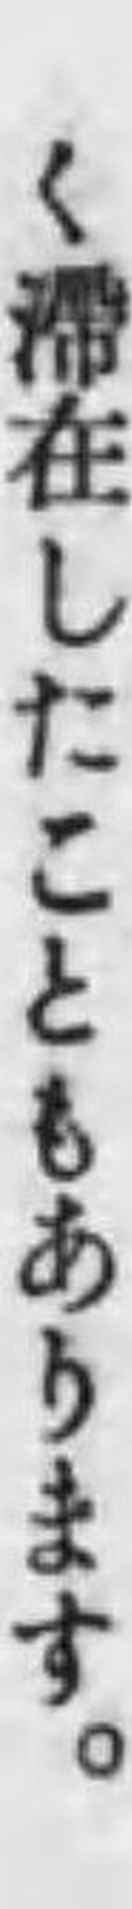く滞在したこともあります。
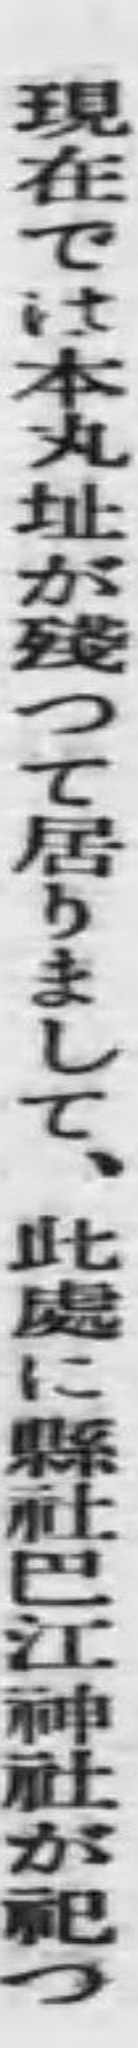現在では本丸址が残つて居りまして、此処に県社巴江神社が祀つ
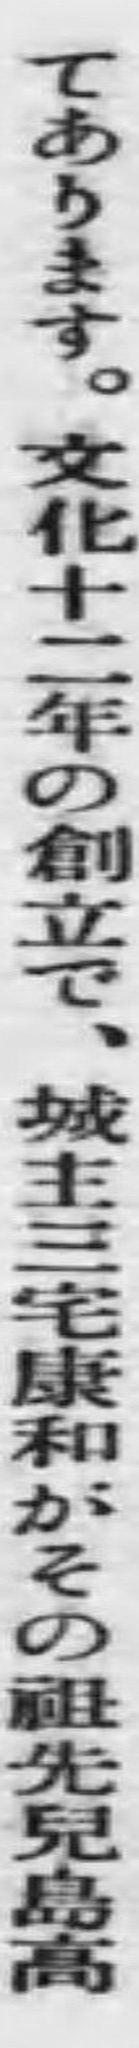てあります。文化十二年の創立で、城主三宅康和がその祖先児島高
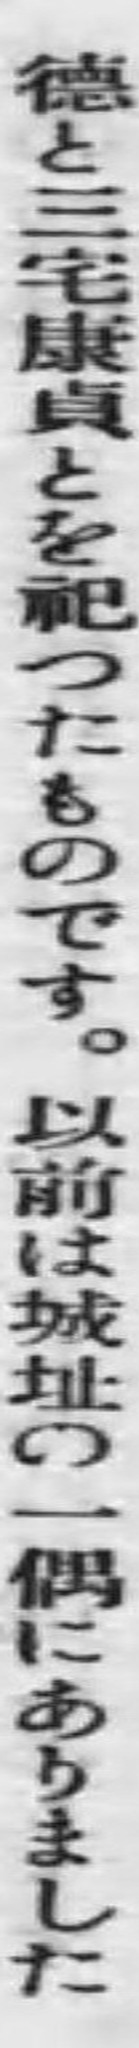徳と三宅康貞とを祀つたものです。以前は城址の一偶にありました
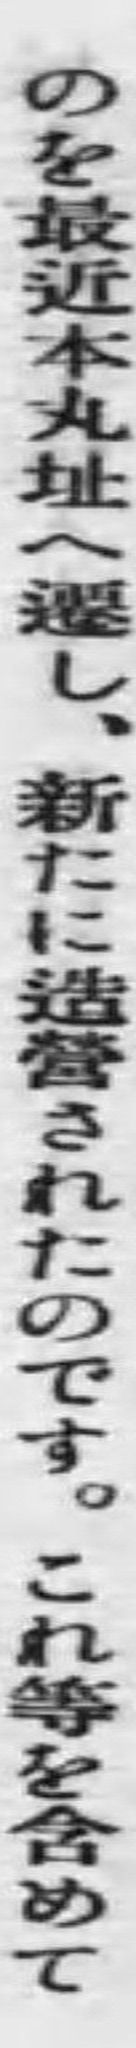のを最近本丸址へ遷し、新たに造営されたのです。これ等を含めて
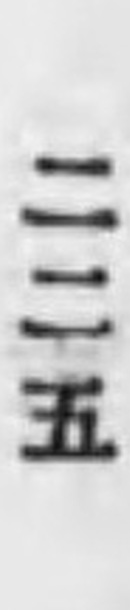二二五

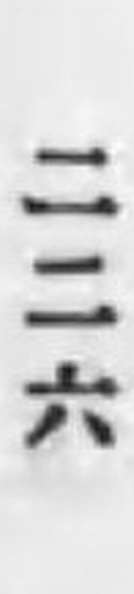二二六
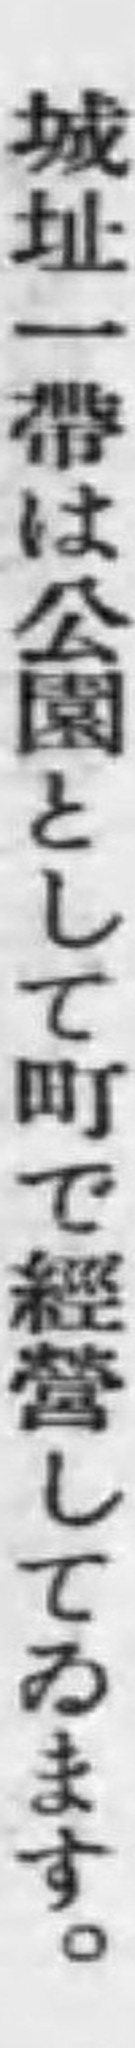城址一帯は公園として町で経営してゐます。
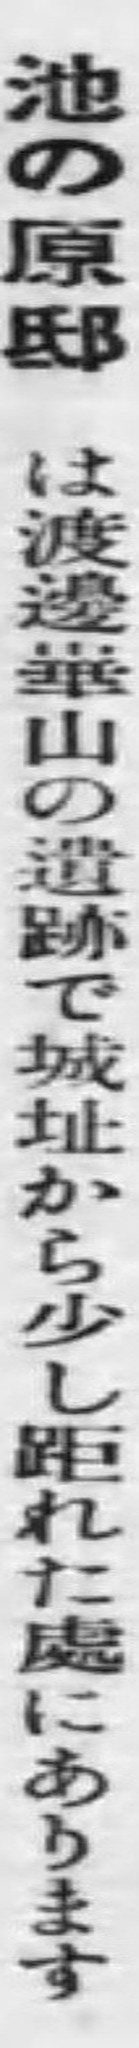池の原邸は渡辺崋山の遺跡で城址から少し距れた処にあります
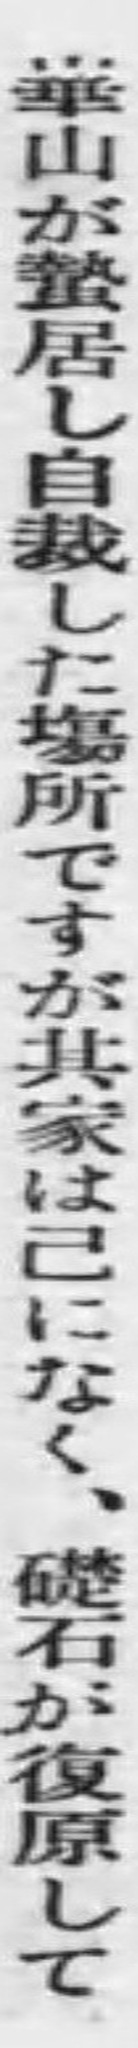崋山が蟄居し自裁した場所ですが其家は己になく、礎石が復原して
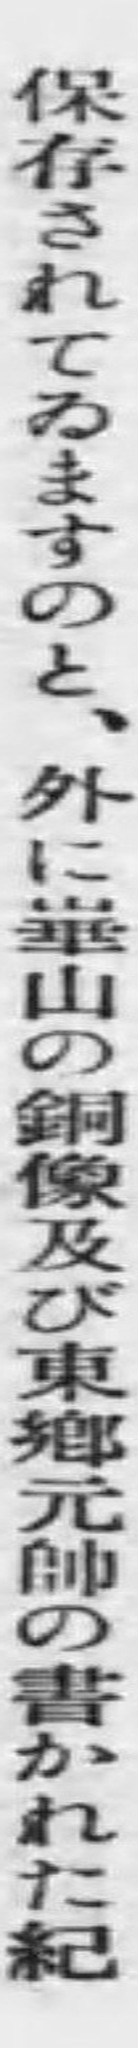保存されてゐますのと、外に崋山の銅像及び東郷元帥の書かれた紀
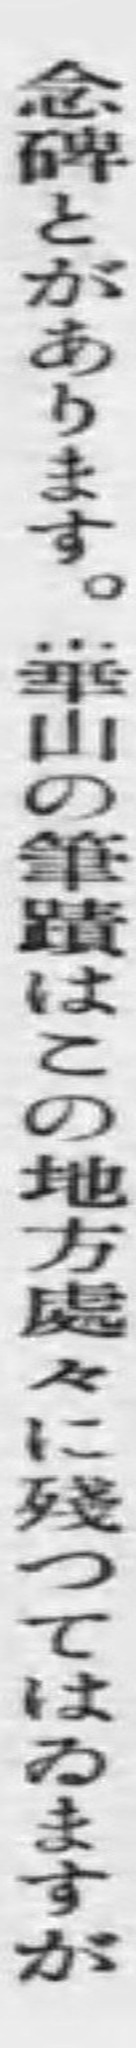念碑とがあります。崋山の筆蹟はこの地方処々に残つてはゐますが
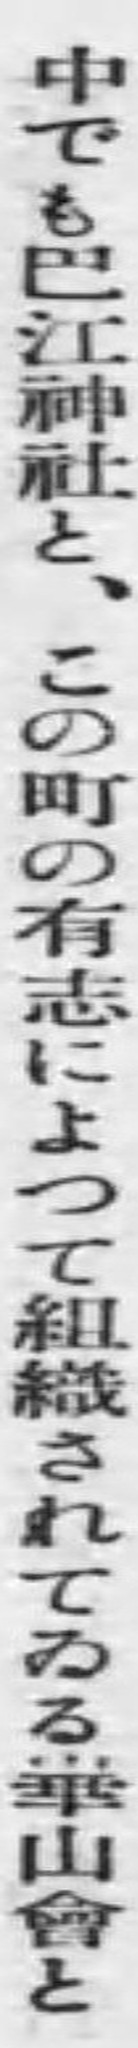中でも巴江神社と、この町の有志によつて組織されてゐる崋山会と
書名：東三河道中記 : 豊橋市及其附近案内
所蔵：国立国会図書館 National Diet Library, JAPAN
